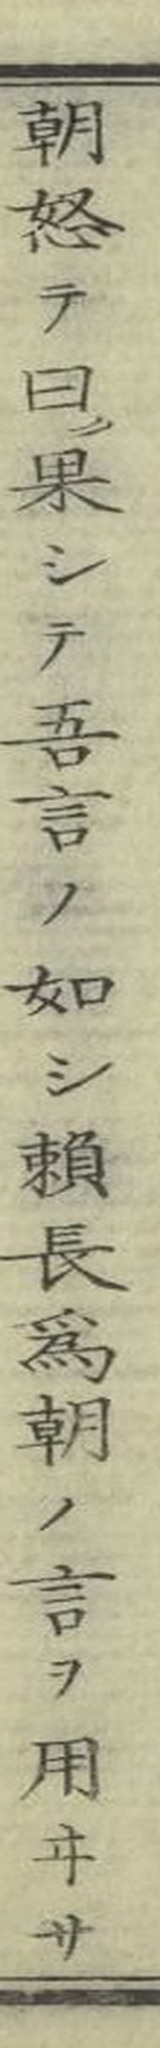朝怒テ曰果シテ吾言ノ如シ賴長爲朝ノ言ヲ用ヰサ
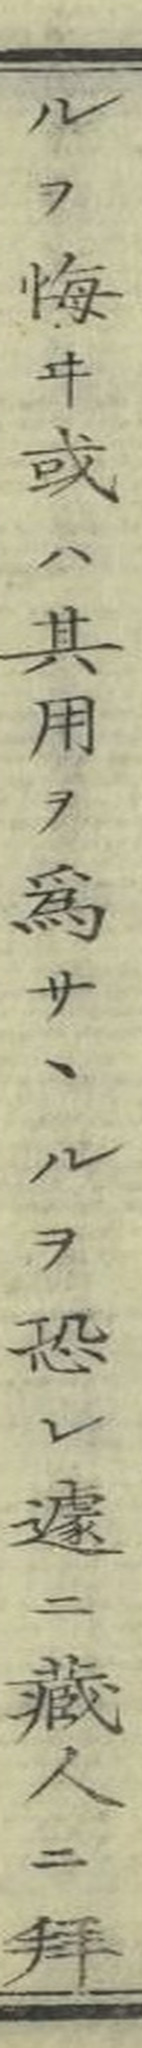ルヲ悔ヰ或ハ其用ヲ爲サヽルヲ恐レ遽ニ藏人ニ拜
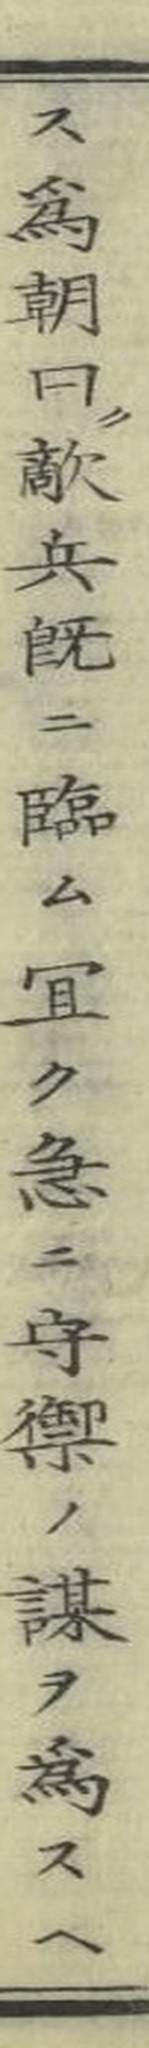ス爲朝曰歒兵既ニ臨ム冝ク急ニ守禦ノ謀ヲ爲スヘ
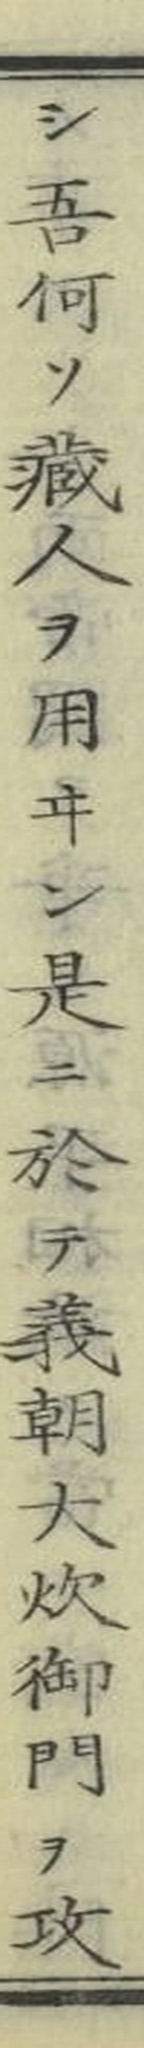シ吾何ソ藏人ヲ用ヰン是ニ於テ義朝大炊御門ヲ攻
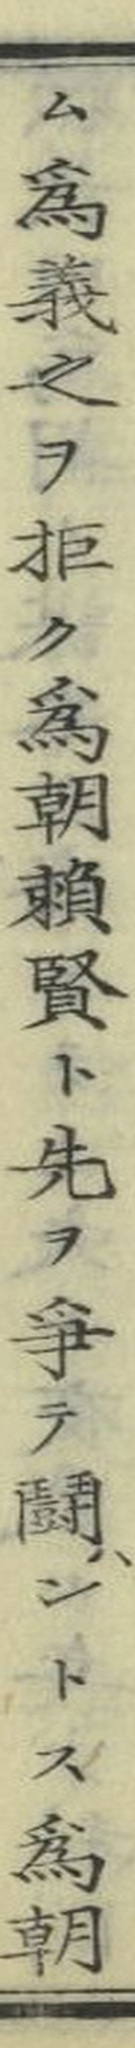ム爲義之ヲ拒ク爲朝賴賢ト先ヲ爭テ闘ントス爲朝
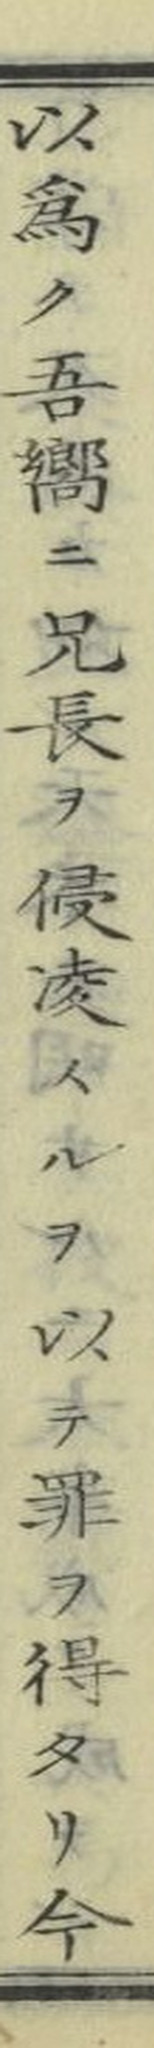以爲ク吾嚮ニ兄長ヲ侵凌スルヲ以テ罪ヲ得タリ今
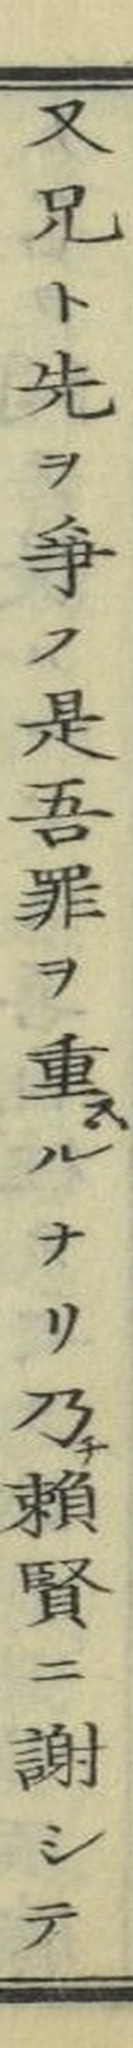又兄ト先ヲ爭フ是吾罪ヲ重ルナリ乃頼賢ニ謝シテ
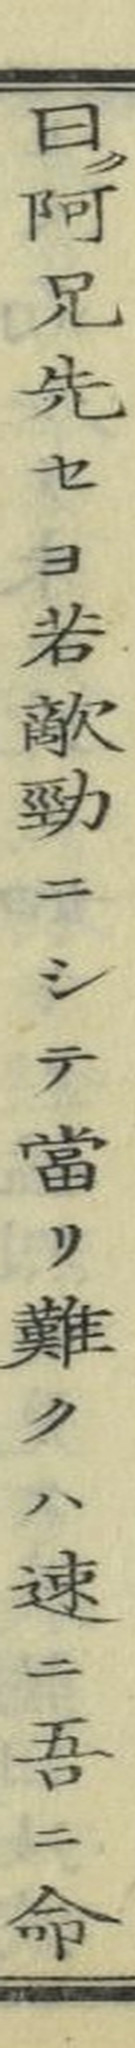曰阿先セヨ若歒勁ニシテ當リ難クハ速ニ吾ニ命
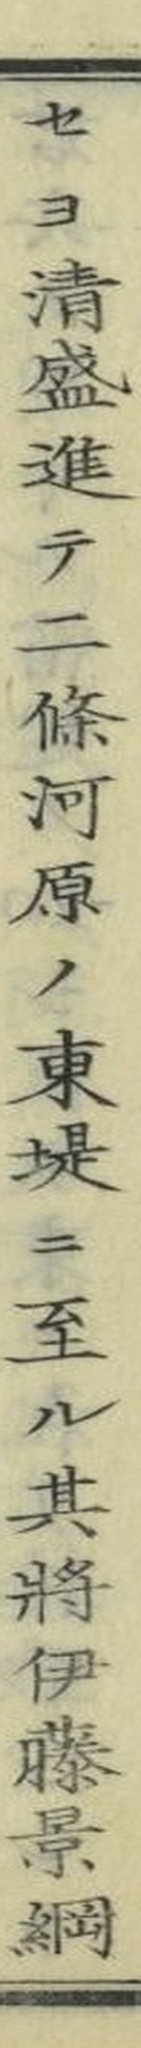セヨ清盛進テ二條河原ニ東堤ニ至ル其將伊藤景綱
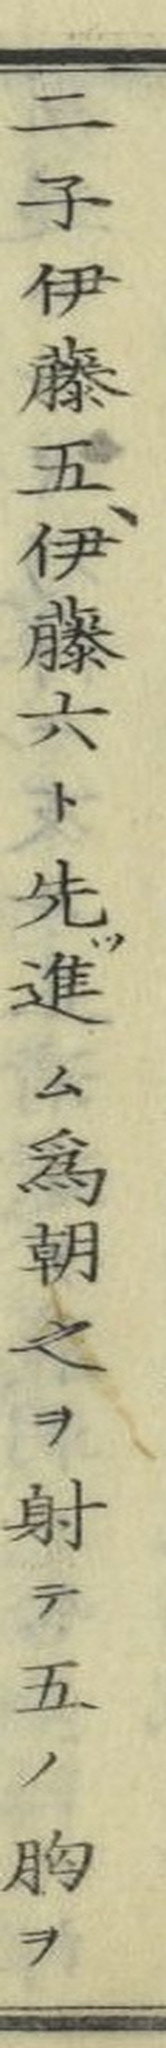二子伊藤五、伊藤六ト先進ム爲朝之射テ五ノ胸ヲ
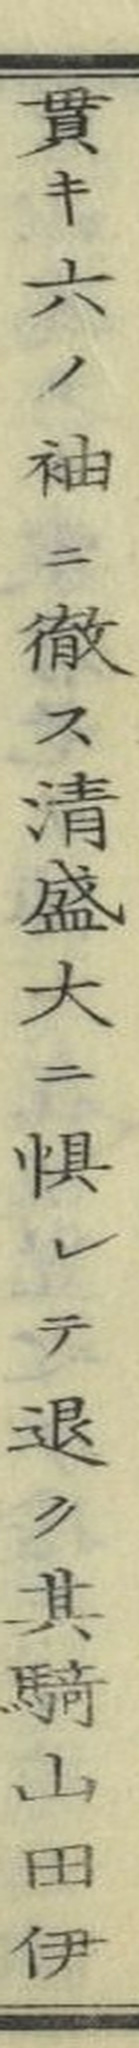貫キ六ノ袖ニ徹ス清盛大ニ惧レテ退ク其騎山田伊
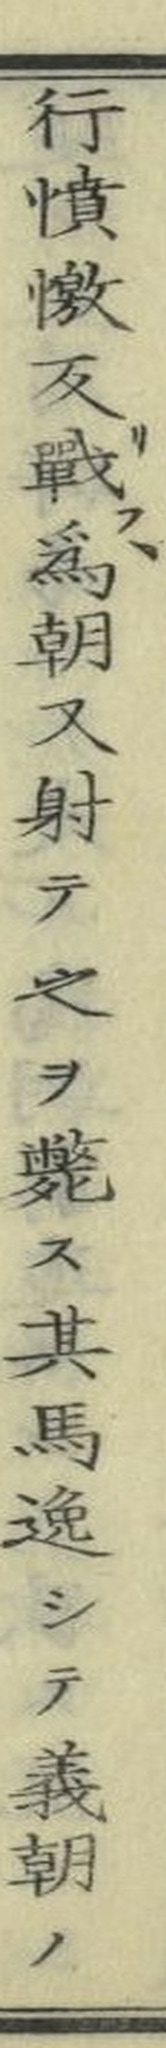行憤憿反戰、爲朝又射テ之ヲ斃ス其馬逸シテ義朝ノ
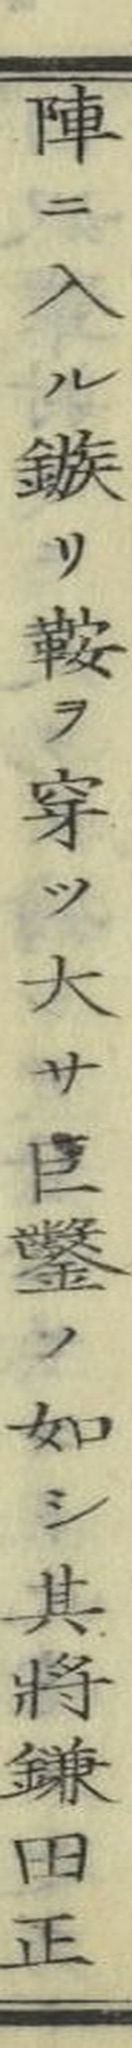陣ニ入ル鏃リ鞍ヲ穿ツ大サ巨鑒ノ如シ其將鎌田正
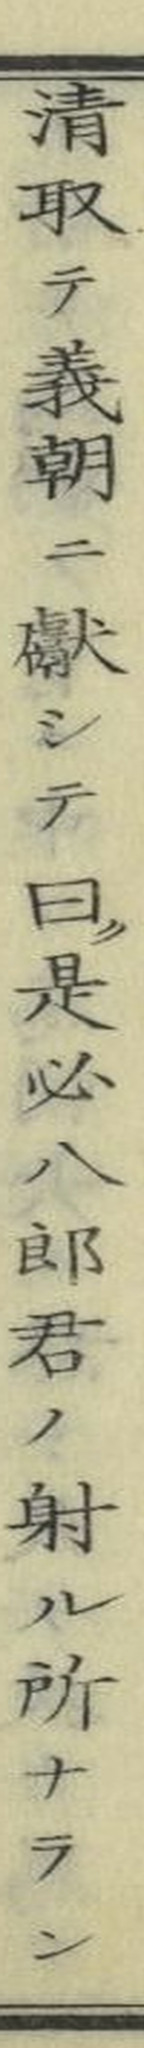清取テ義朝ニ獻シテ曰是必八郎君ノ射ル所ナラン
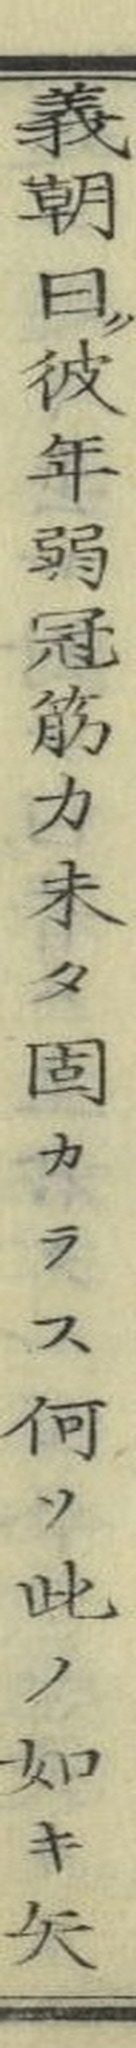義朝曰彼年弱冠筋力未タ固カラス何ソ此ノ如キ矢
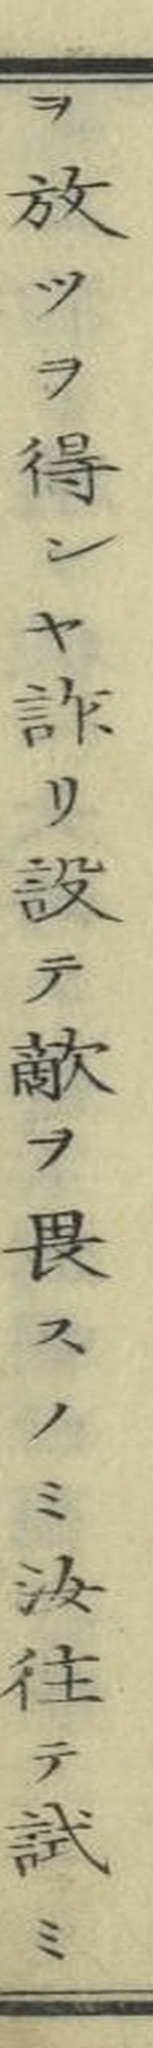ヲ放ツヲ得ンヤ詐リ設テ歒ヲ畏スノミ汝往テ試ミ
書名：琉球藩史 一之巻
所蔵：University of the Ryukyus Library
